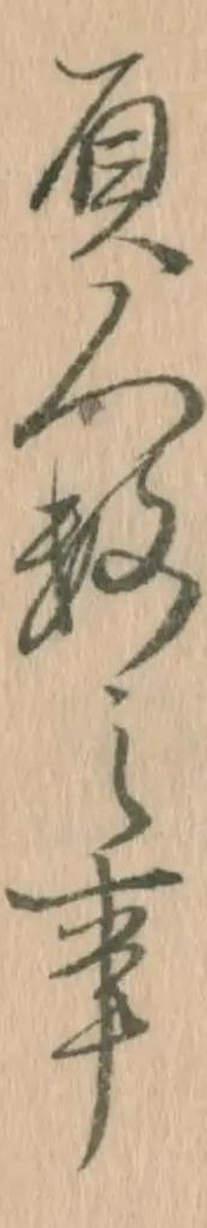負人数之事
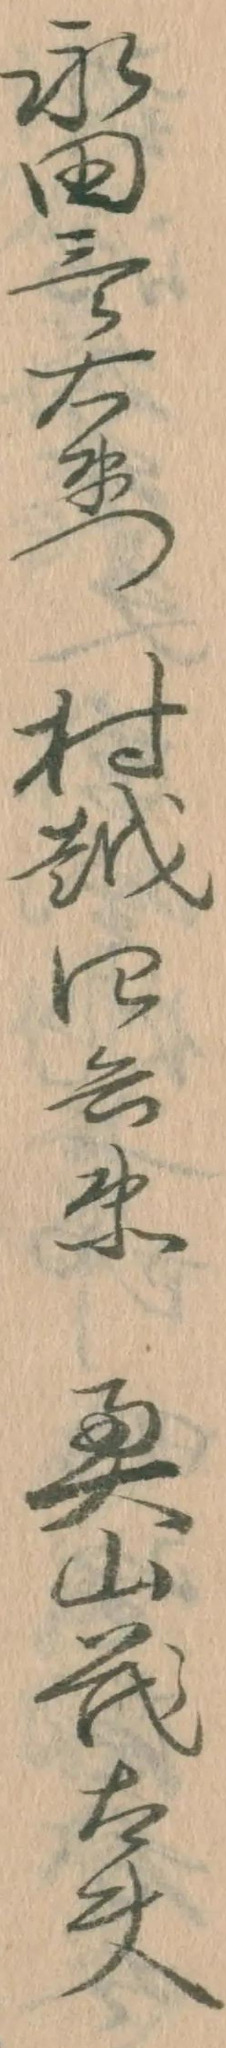永田三郎右衛門村越四兵衛奥山茂太夫
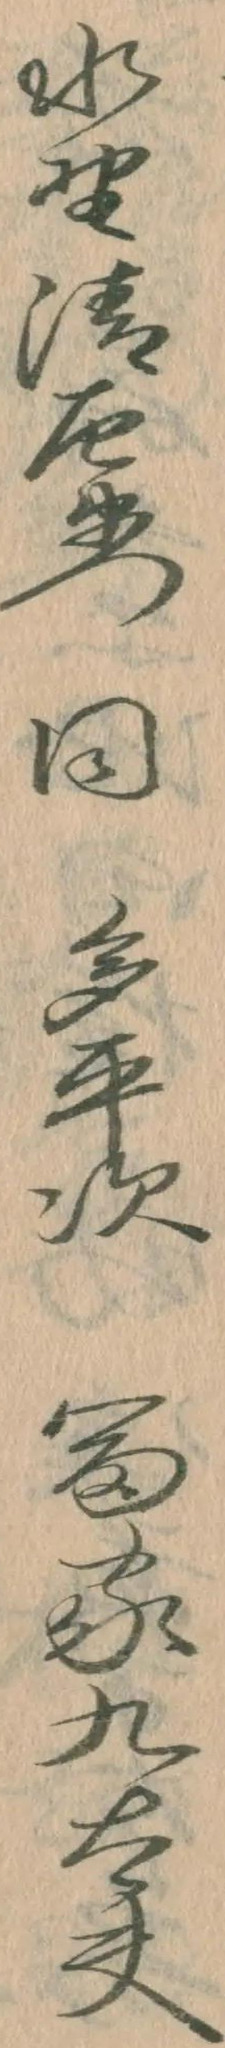水野清左衛門同多平次冨家九太夫
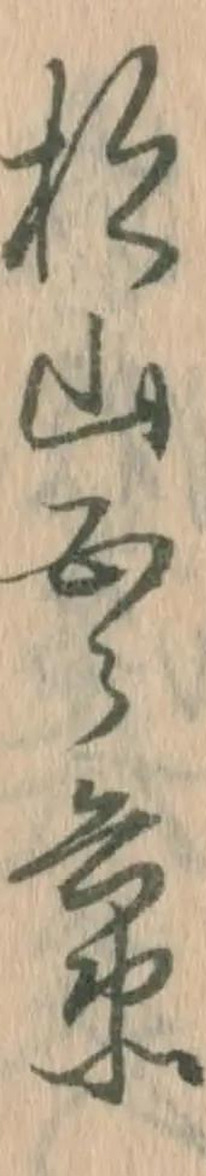杉山五郎兵衛
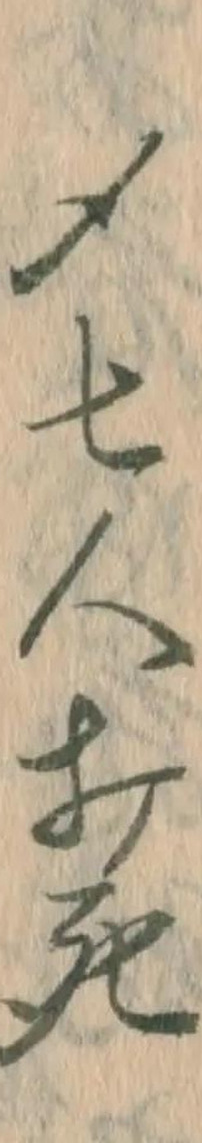〆七人打死
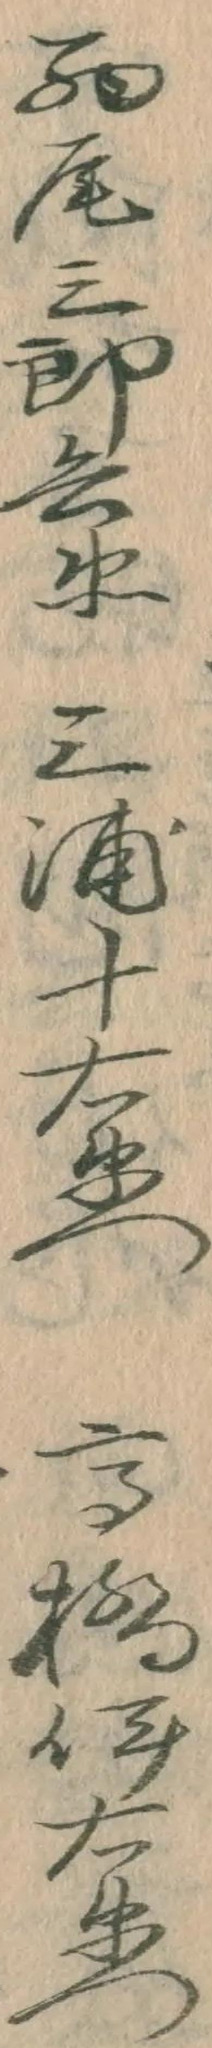西尾三郎兵衛三浦十右衛門高橋伊右衛門
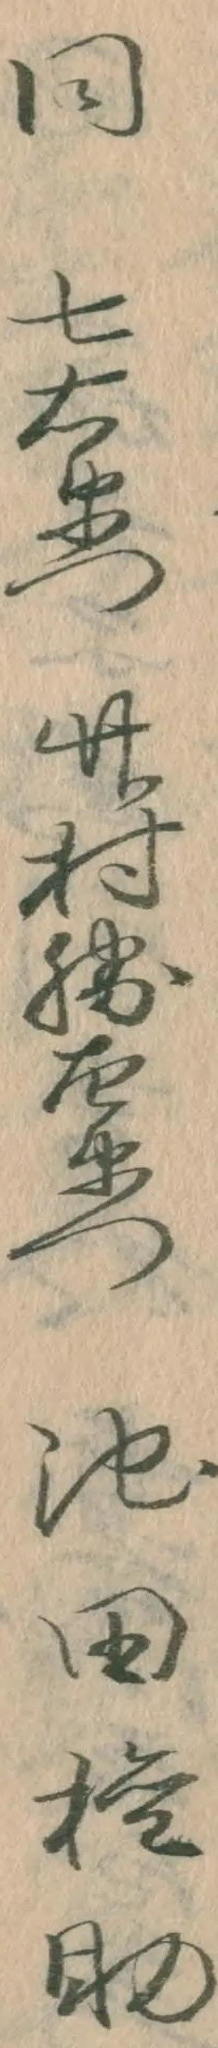同七右衛門竹村勝左衛門池田権助
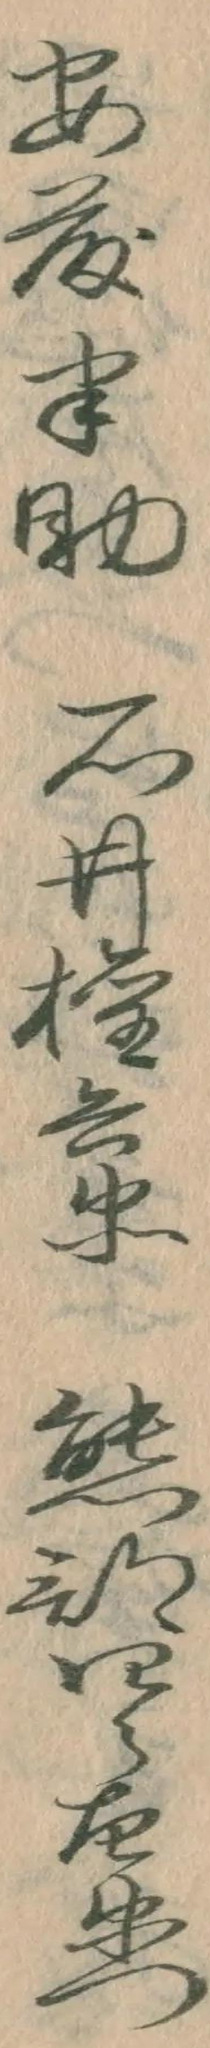安藤半助石井権兵衛熊部四郎左衛門
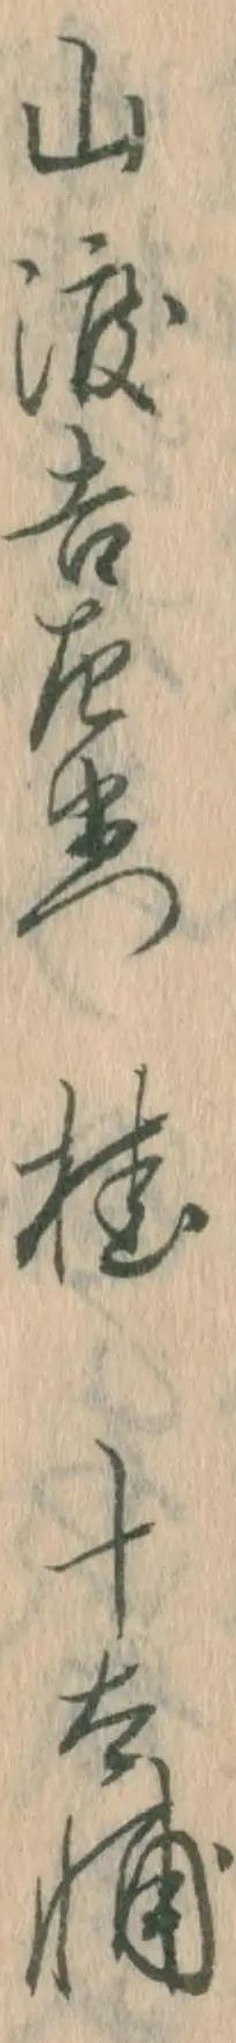山渡吉左衛門桂十太輔
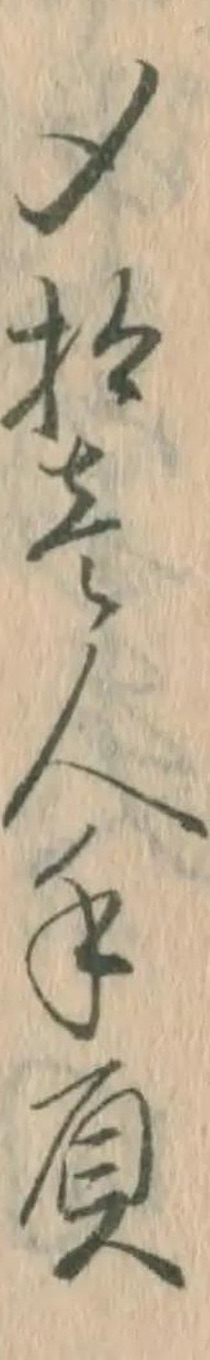〆拾壱人手負
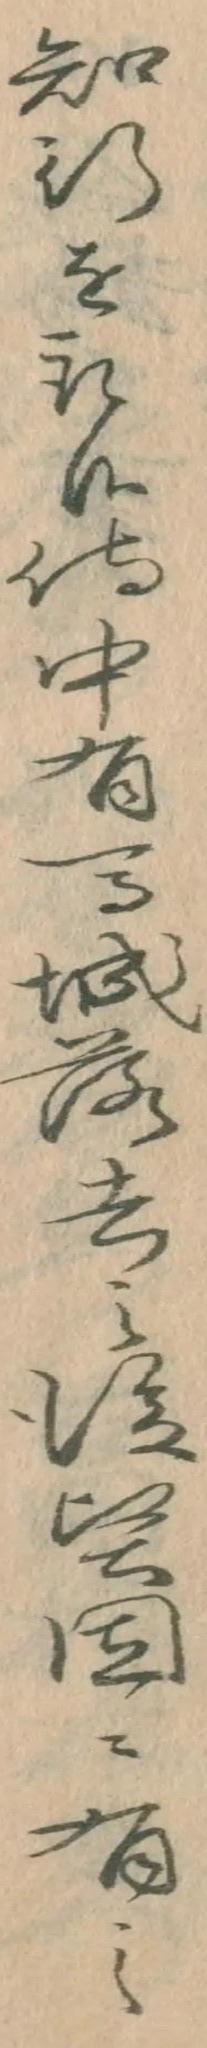知行を取候侍中有馬城落去之後堅固に有之

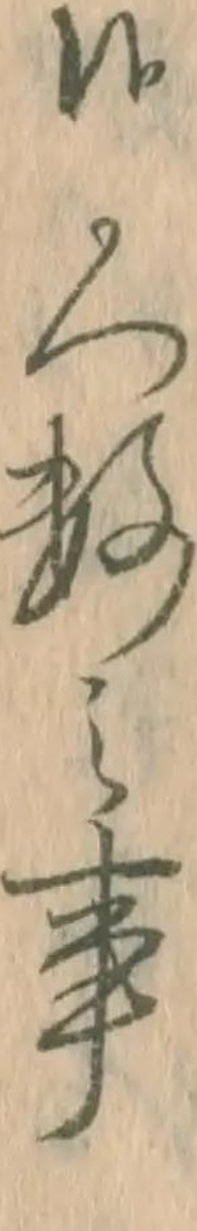候人数之事
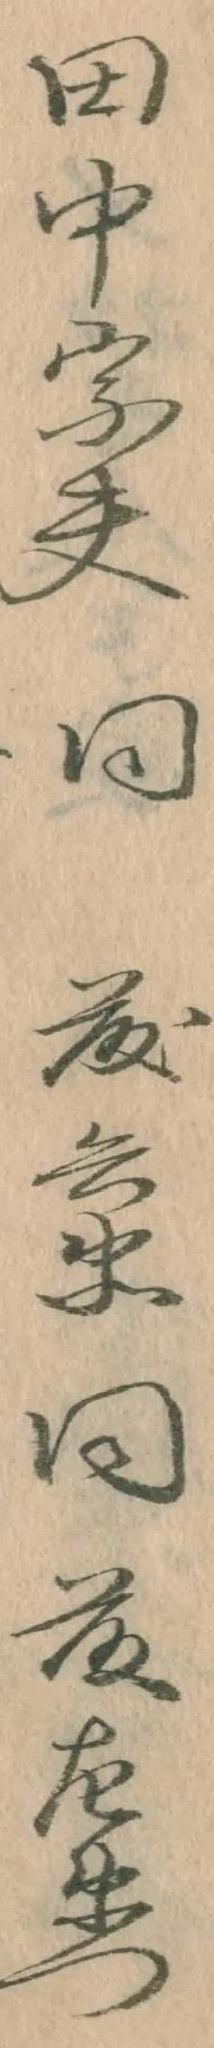田中宗夫同藤兵衛同藤左衛門
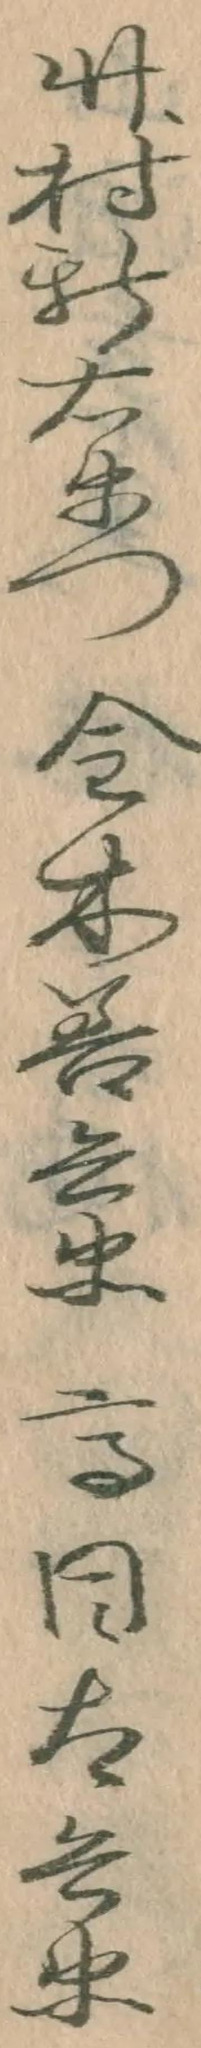竹村新右衛門金木善兵衛高同太兵衛
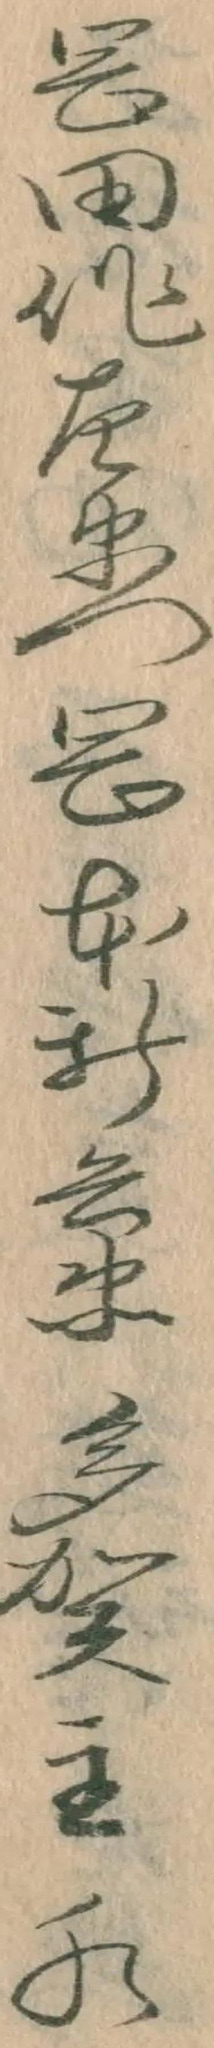岡田作左衛門岡本新兵衛多賀主水
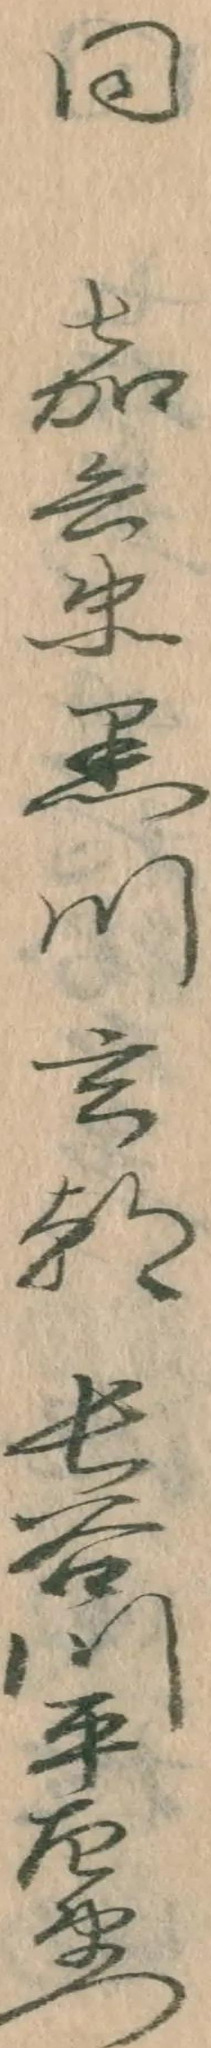同喜兵衛黒川玄朝長谷川平左衛門
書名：切支丹御退治記 49巻. [9]
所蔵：国立国会図書館 National Diet Library, JAPAN
